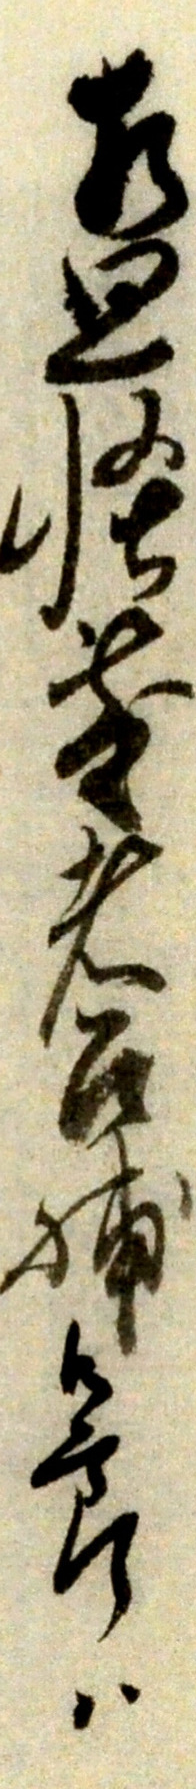相廻怪敷者召捕候節は
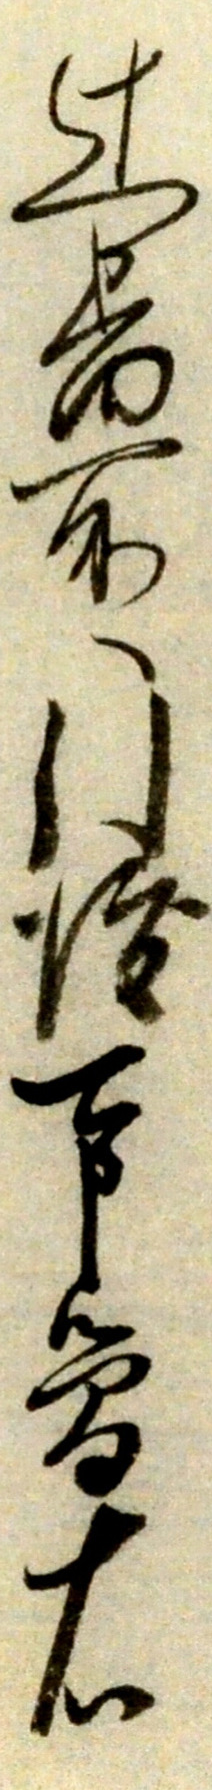辻番所へ引渡可申候間右
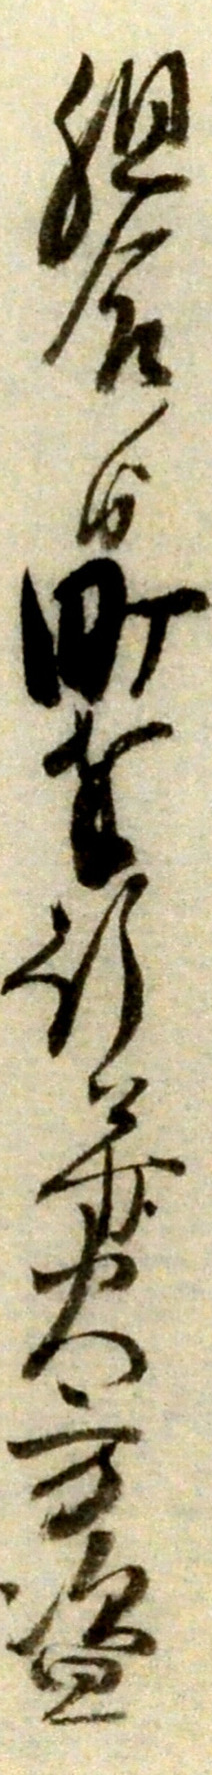組合ゟ町奉行幷火方盗
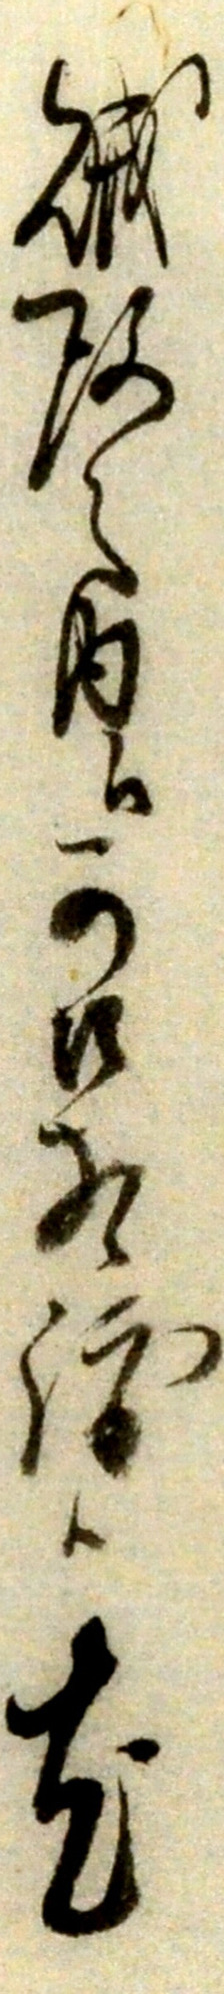賊改之内え可被相渡候尤
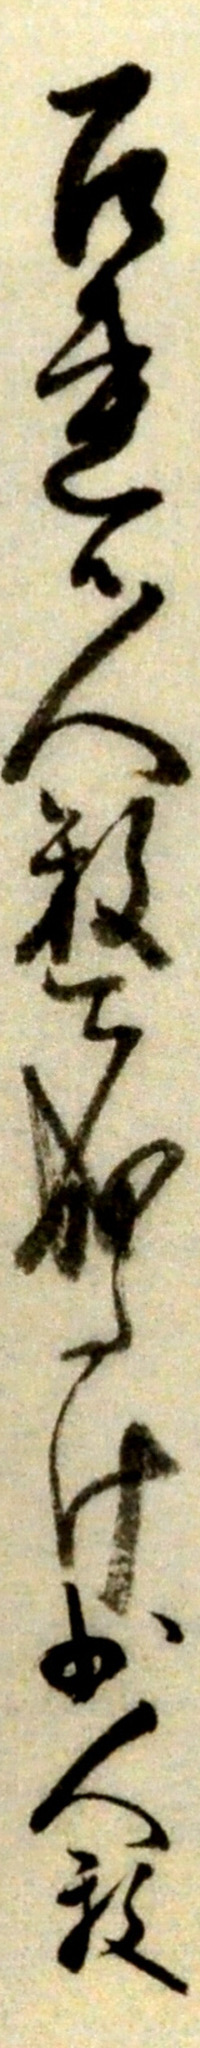召連候人数可成たけ少人数
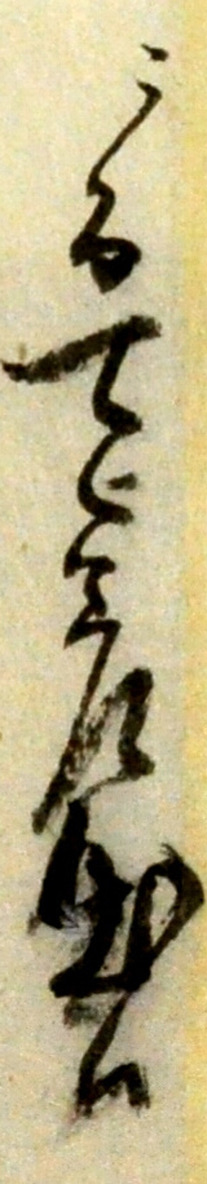にて可被差出候
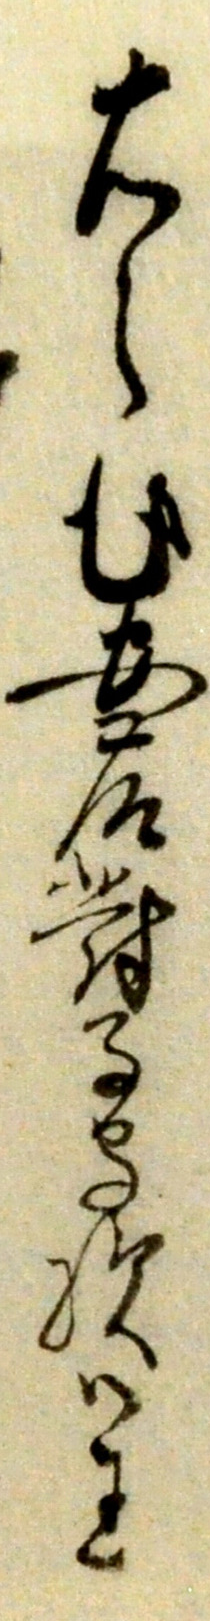右之趣安藤対馬守様御達

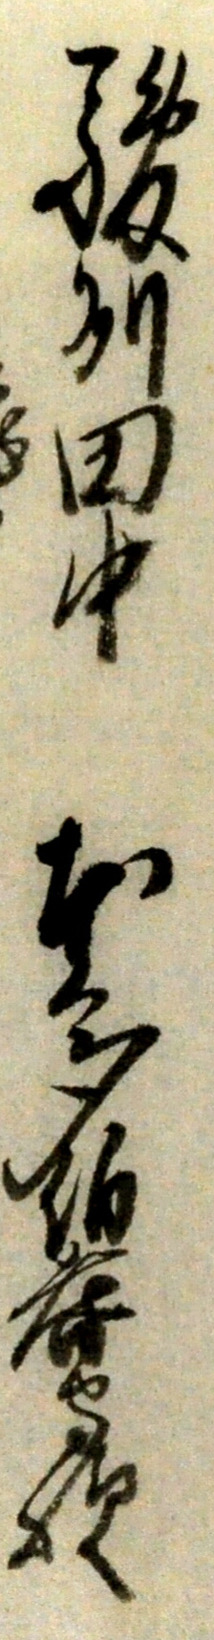駿州田中本多伯耆守様
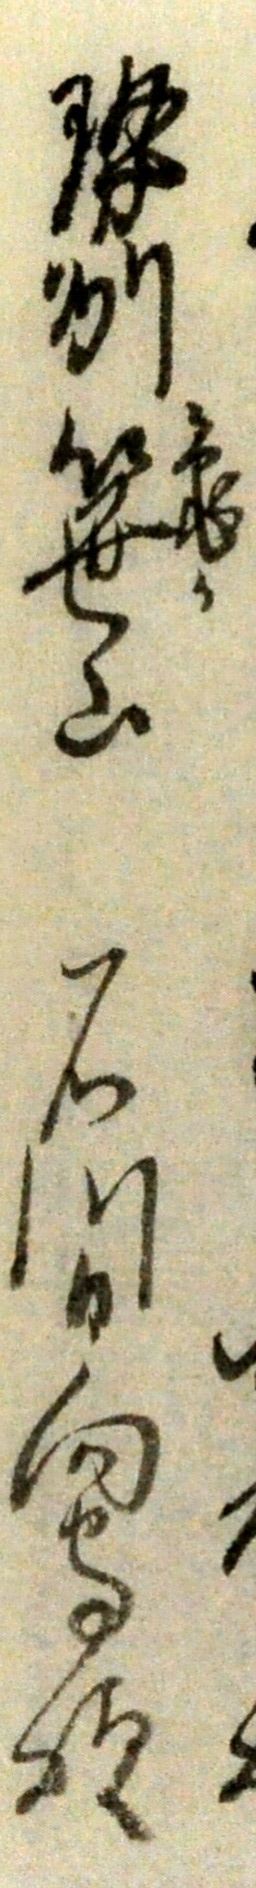勢州笹山石川日向守様
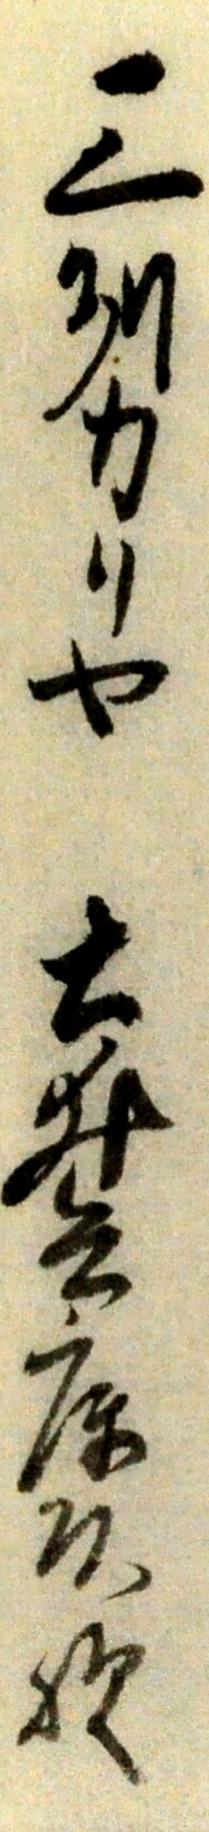三州カリヤ土井兵庫頭様
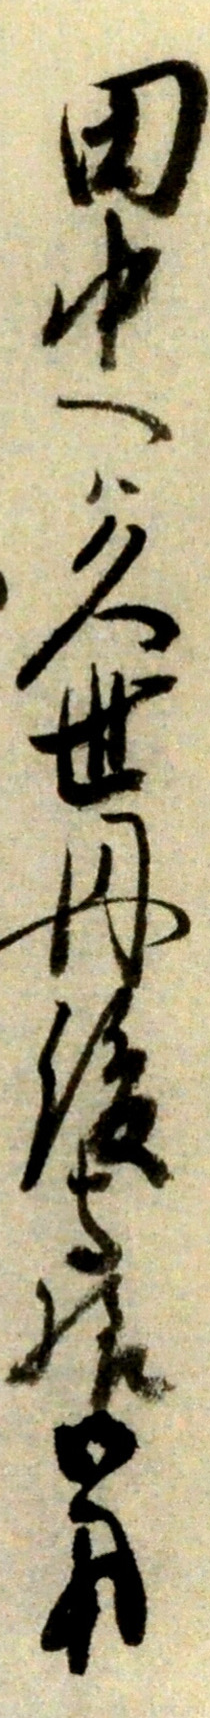田中へは久世丹後守様御用
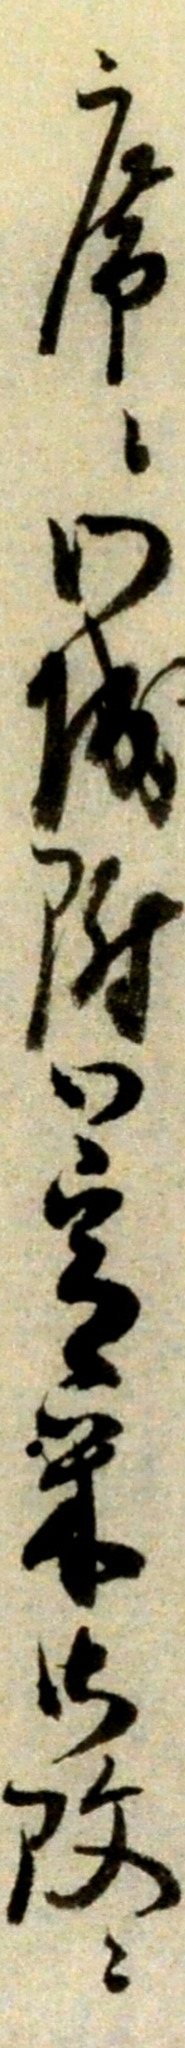席に御城附御定米御改に
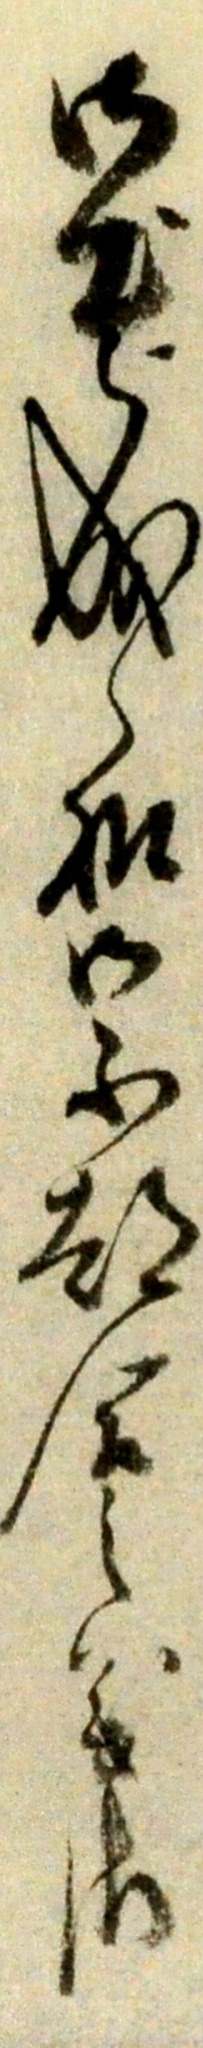御出被成候様御不都合之義御
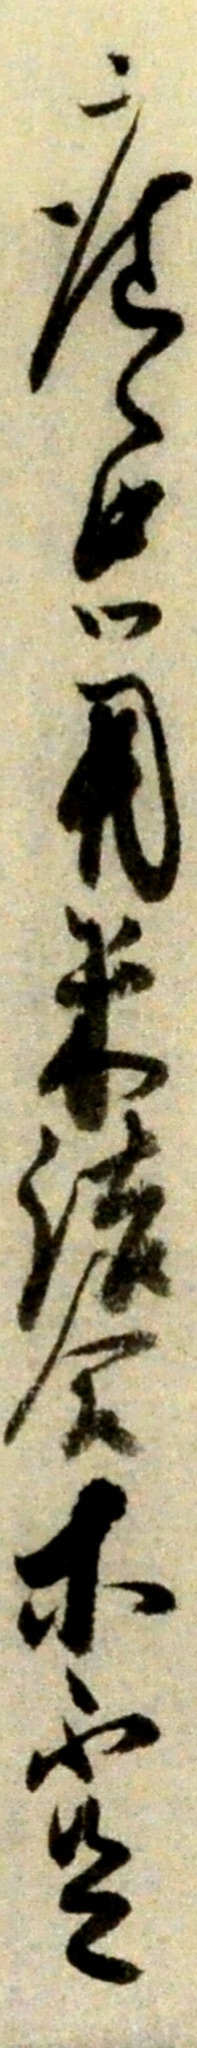座候由御用米詰合等不足
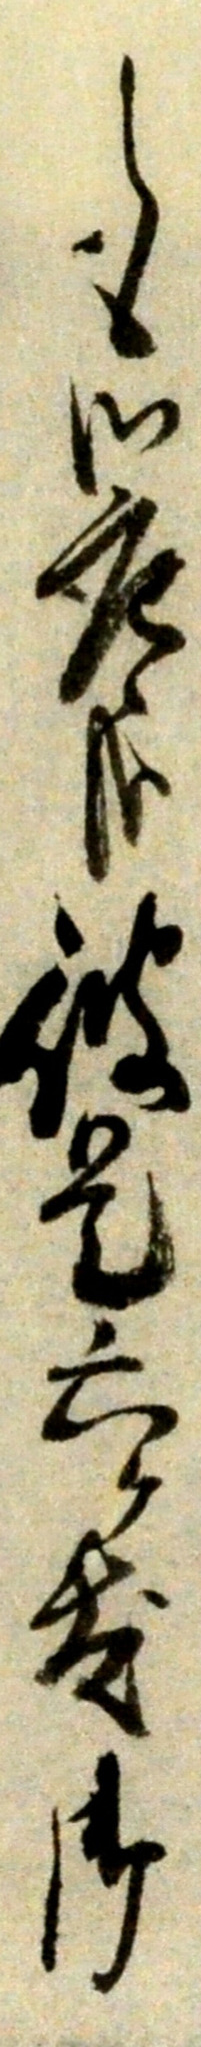候も御座候哉彼是六ヶ敷御
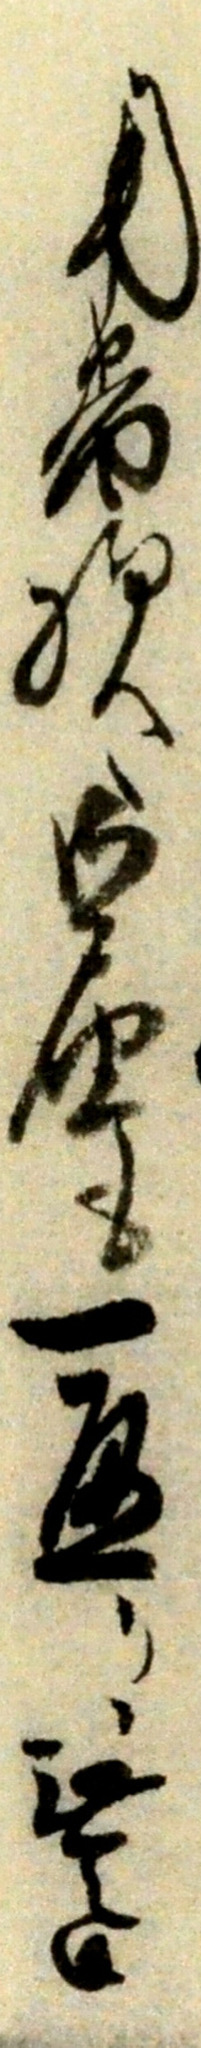用番様へ御届も一通り無之由
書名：申合帳〔一括〕
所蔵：伊那市立高遠町図書館・合同会社AMANE
